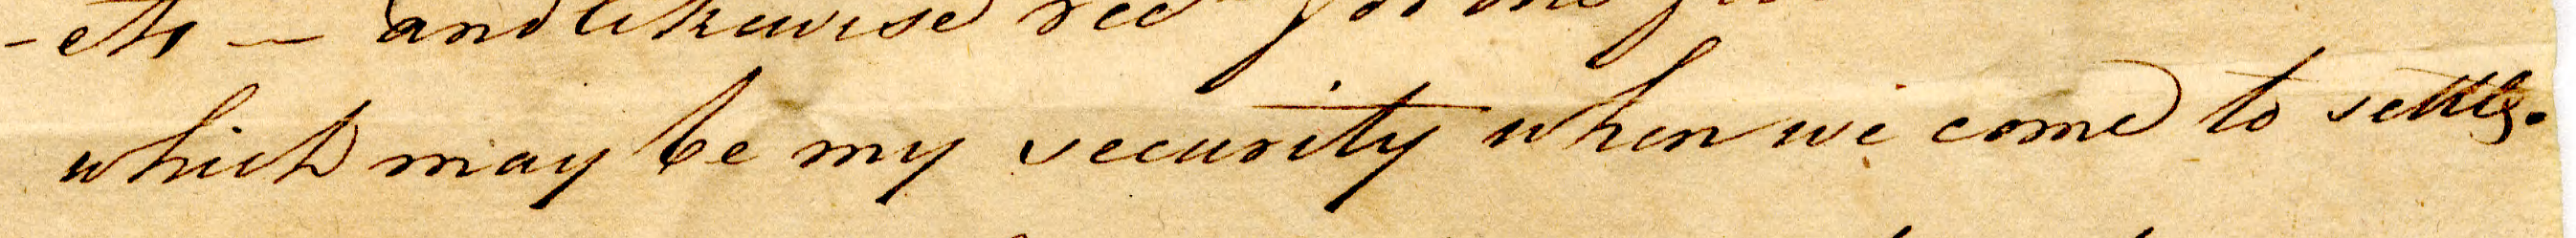which may be my security when we come to settle.
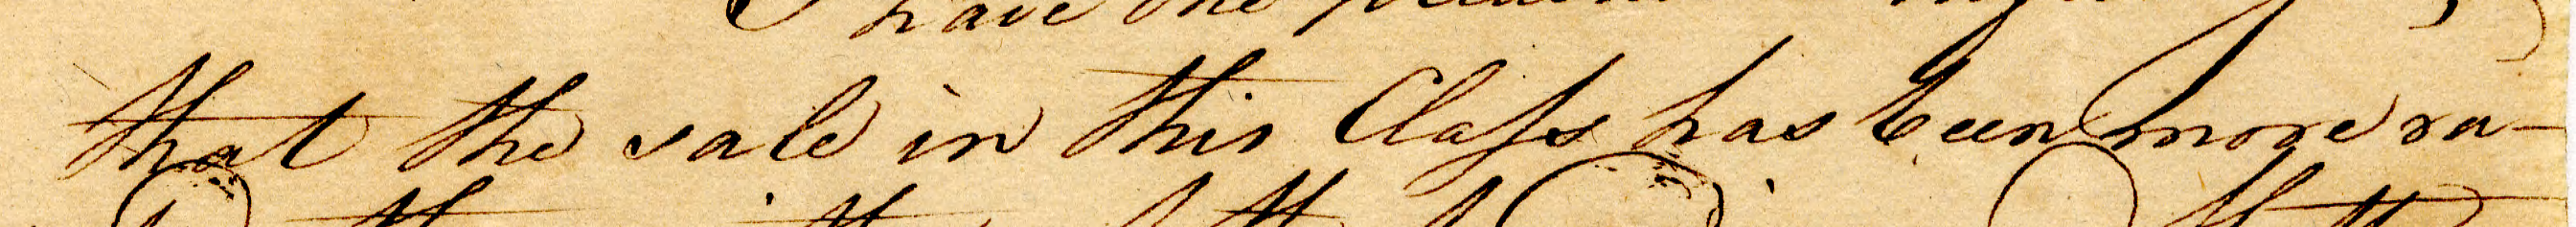that the sale in this Class has been more ra-
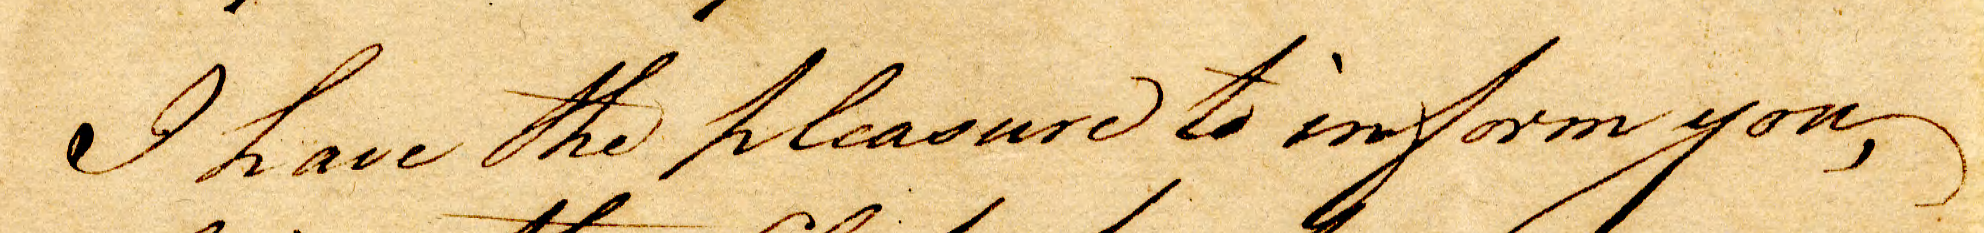I have the pleasure to inform you,
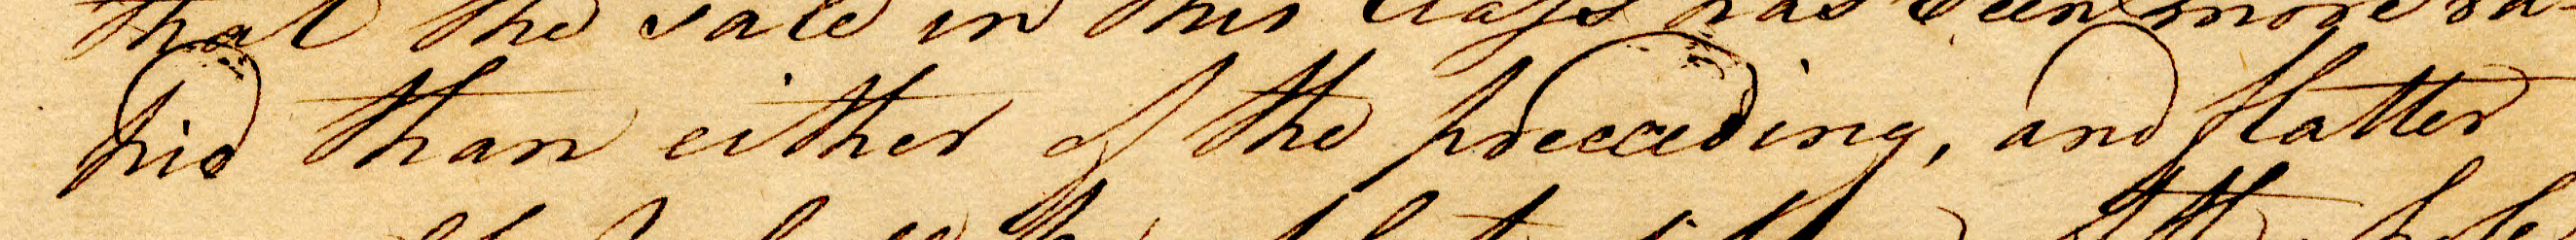pid than either of the preceding, and flatter
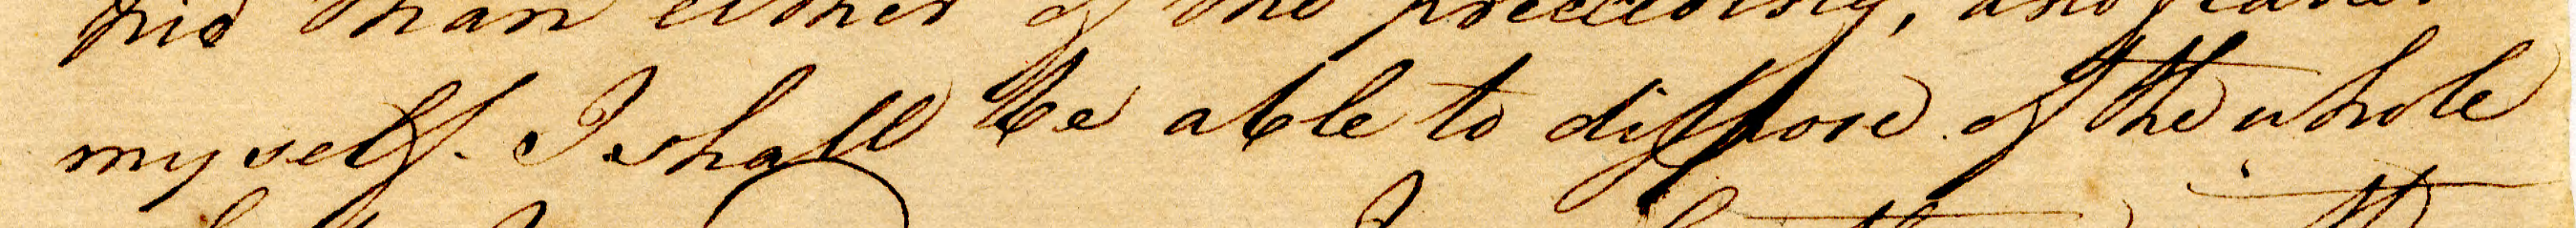my self. I shall be able to dispose of the whole
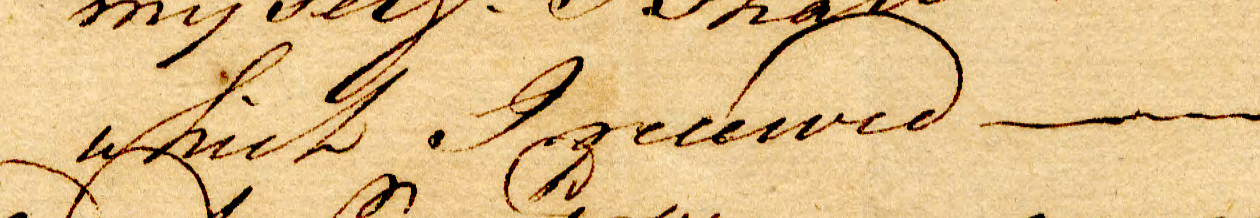which I received-
